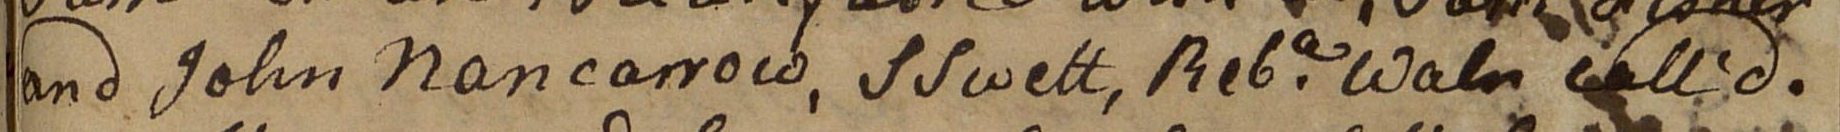and John Nancarrow, S Swett, Reb^a. Waln call'd.
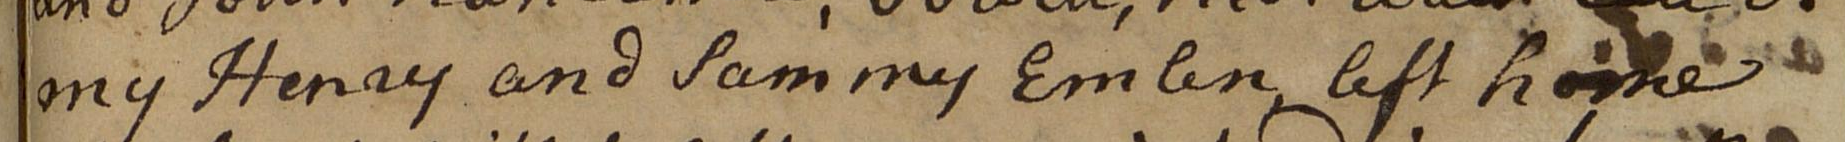my Henry and Sammy Emlen, left home-
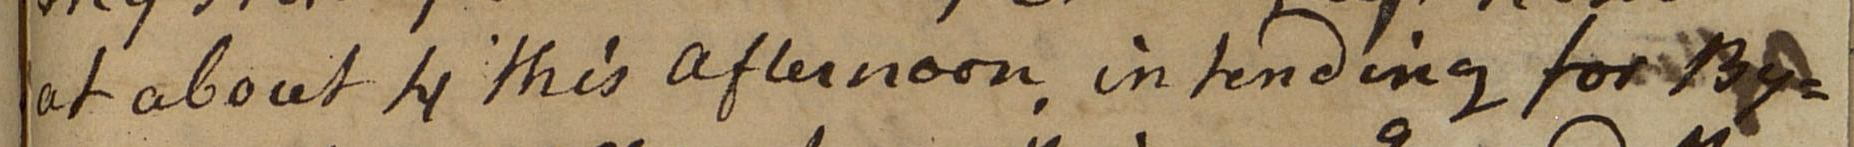at about 4 this Afternoon intending for By-
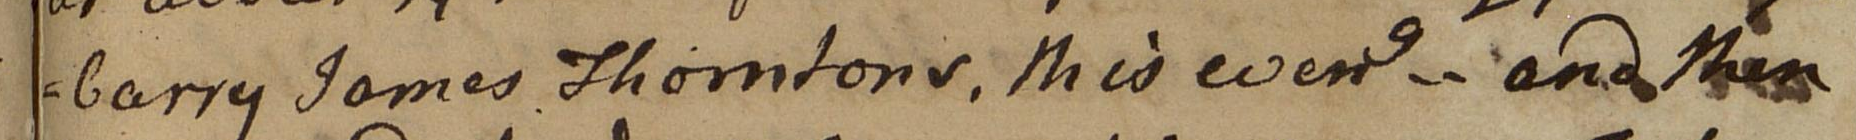-barry James Thorntons, this even^g- and then
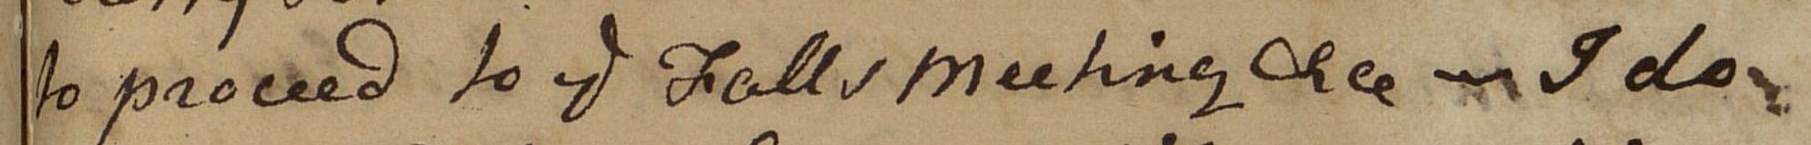to proceed to y^e Falls meeting &c- I do-
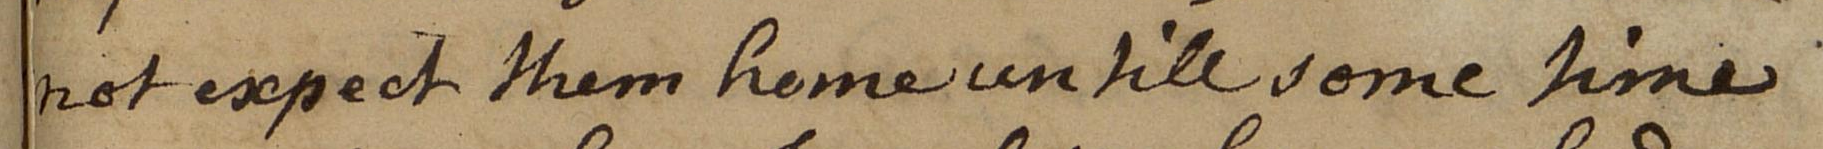not expect them home untill some time
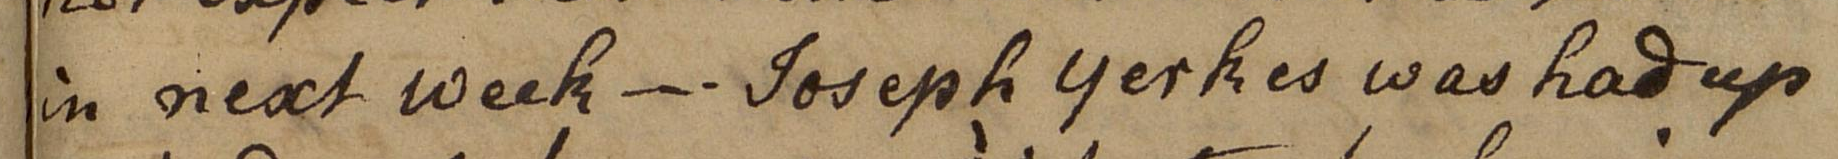in next week- Joseph Yerkes was had up
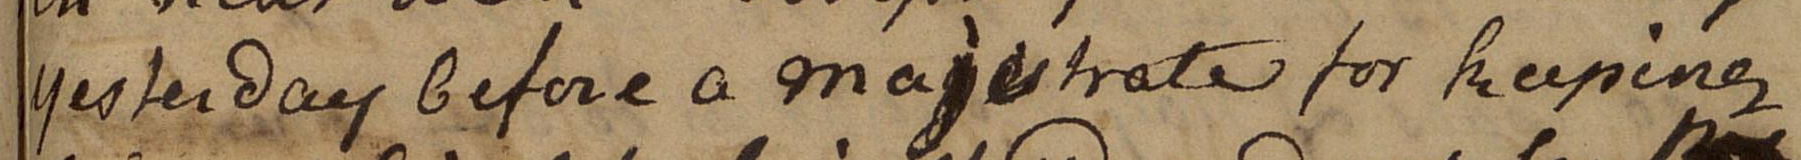yesterday before a Majistrate for keeping
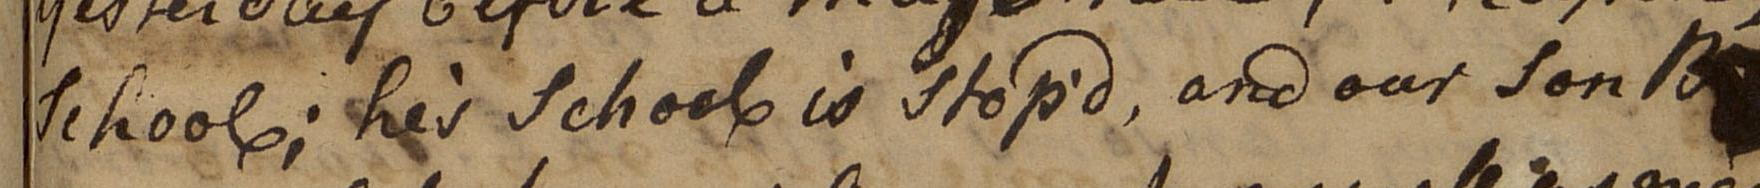School; his School is stop'd, and our Son B
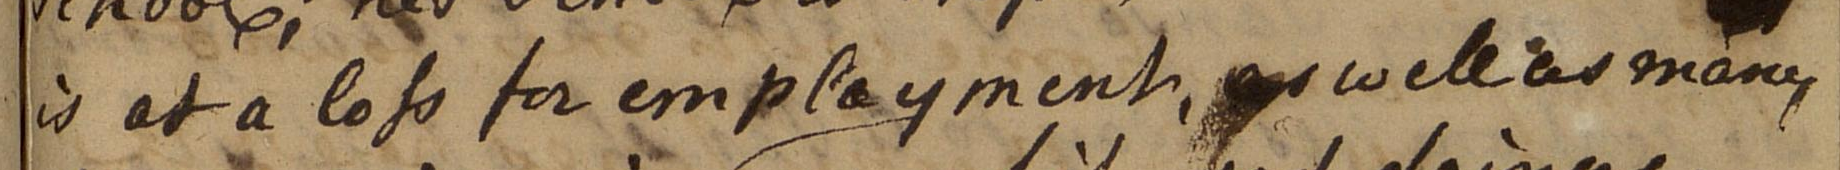is at a loss for employment, as well as many
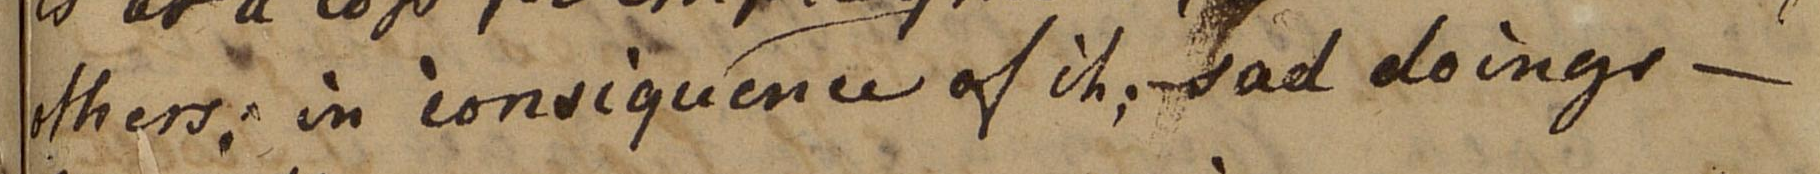others; in consiquence of it, sad doings-
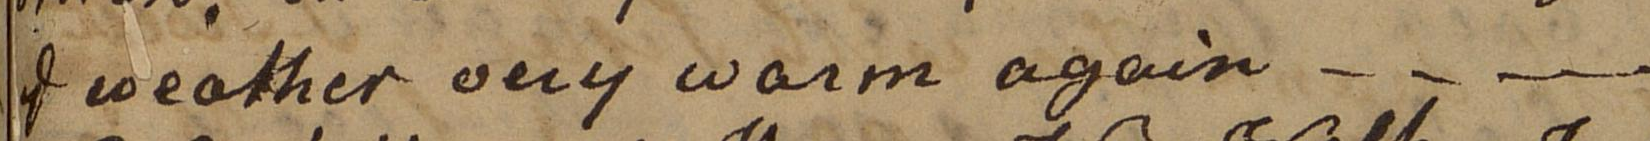y^e weather very warm again---
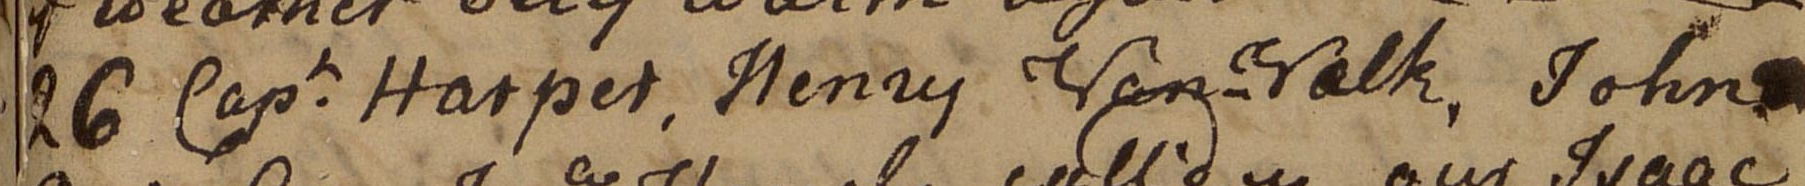26 Cap^t. Harper, Henry Van-Valk, John
